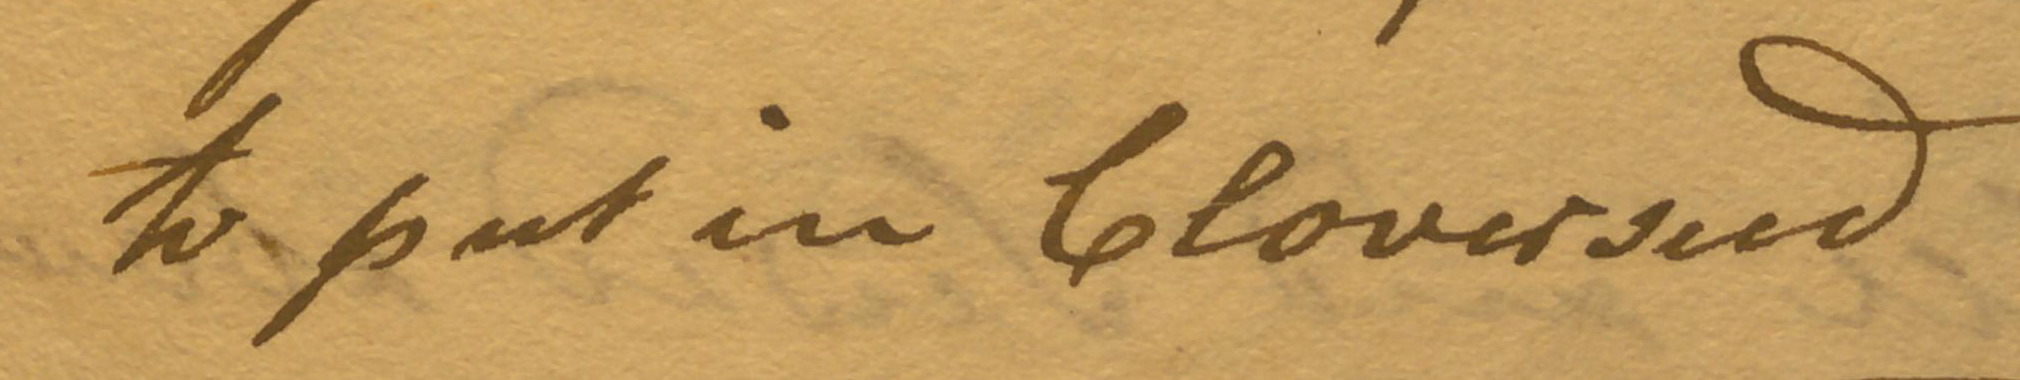to put in Cloverseed
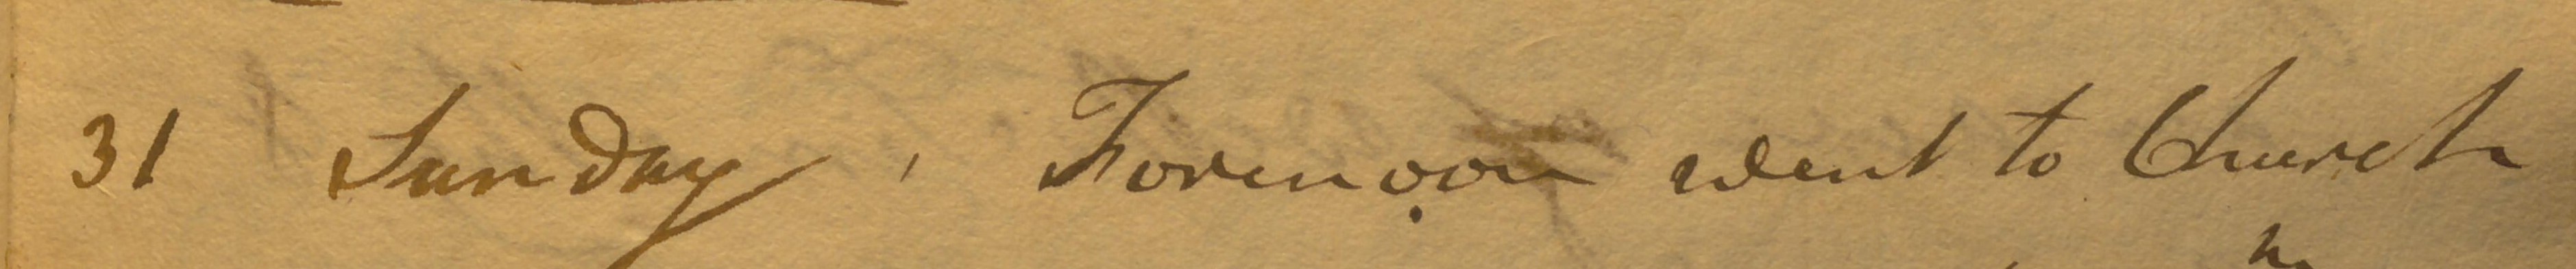31 Sunday. Forenoon went to Church
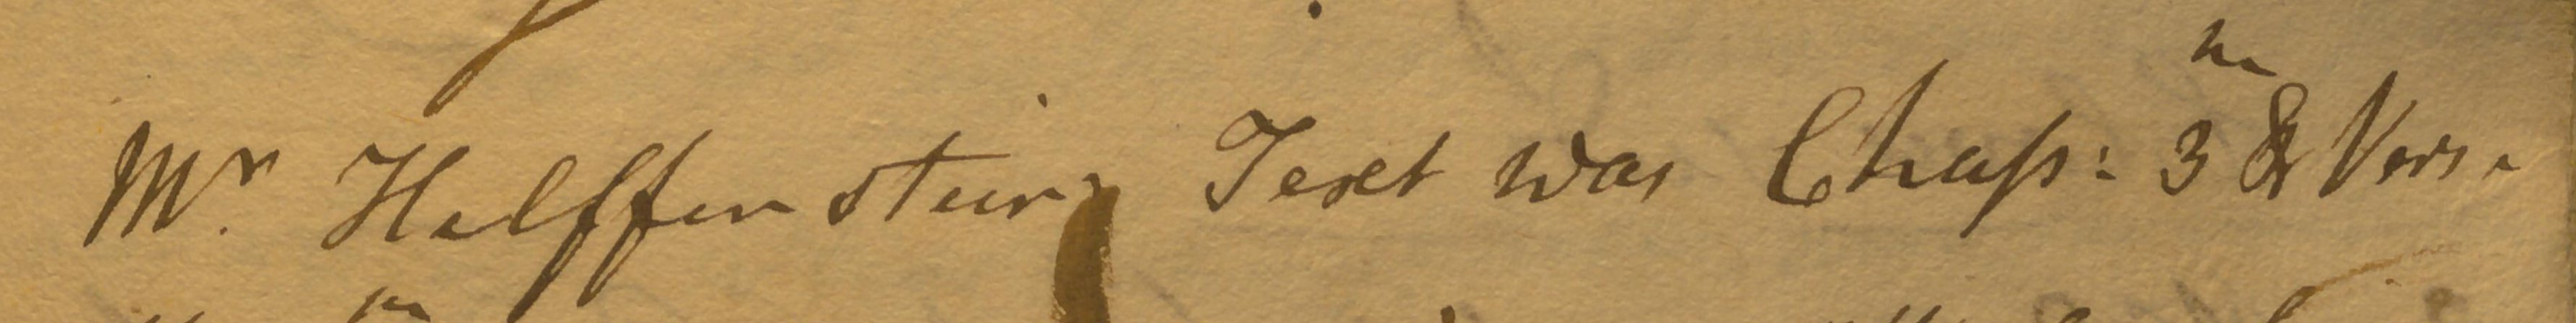M^r. Helffensteins Text was Chap: 3^th & Verse
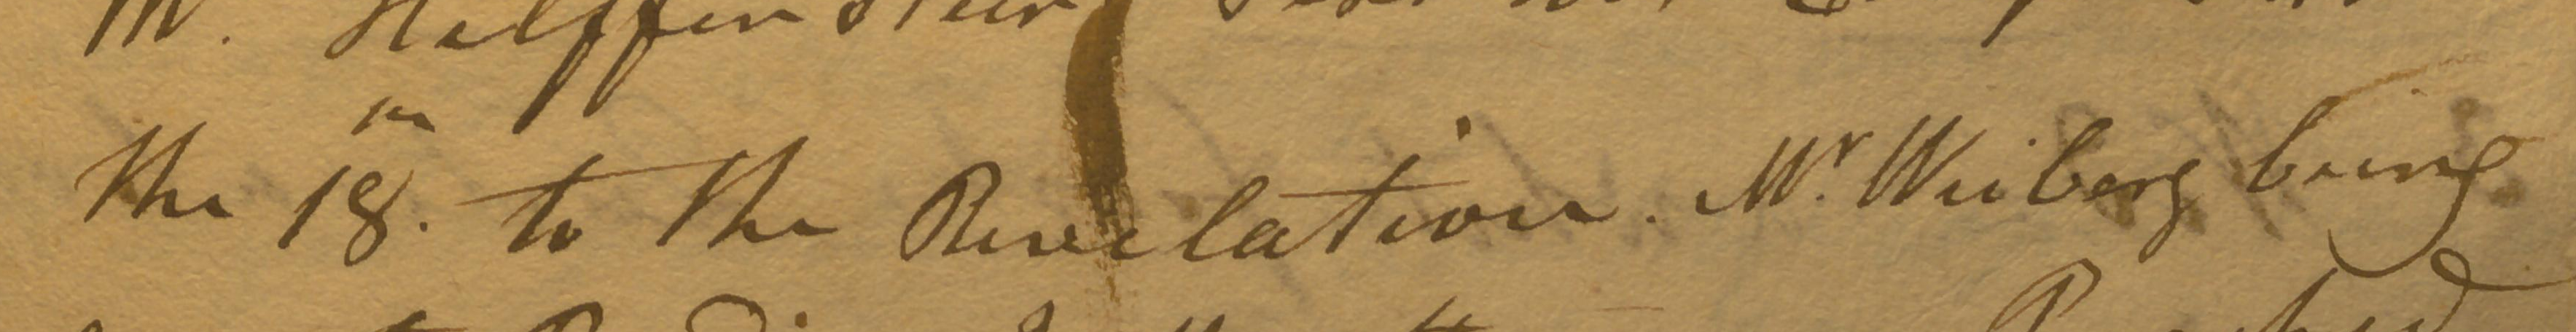the 18^th. to the Revelation M^r. Weiberg being
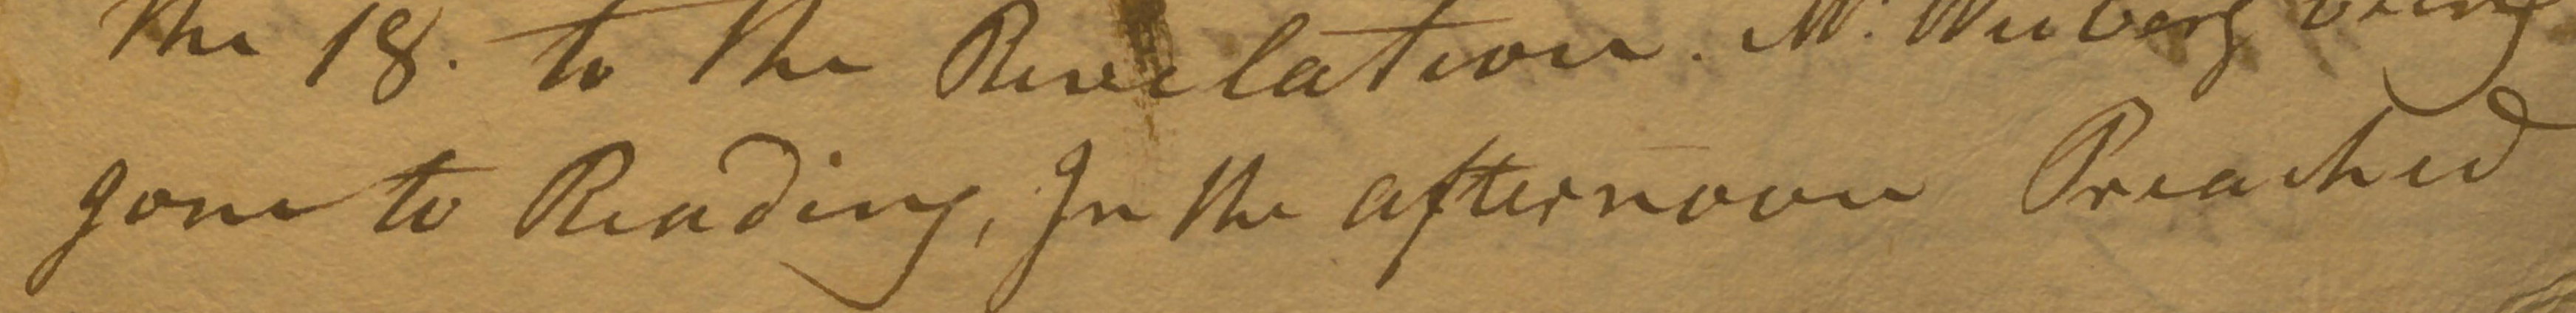gone to Reading, In the afternoon Preached
